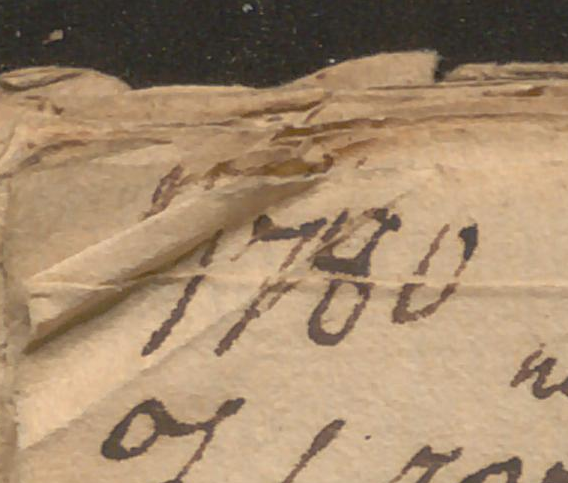1780
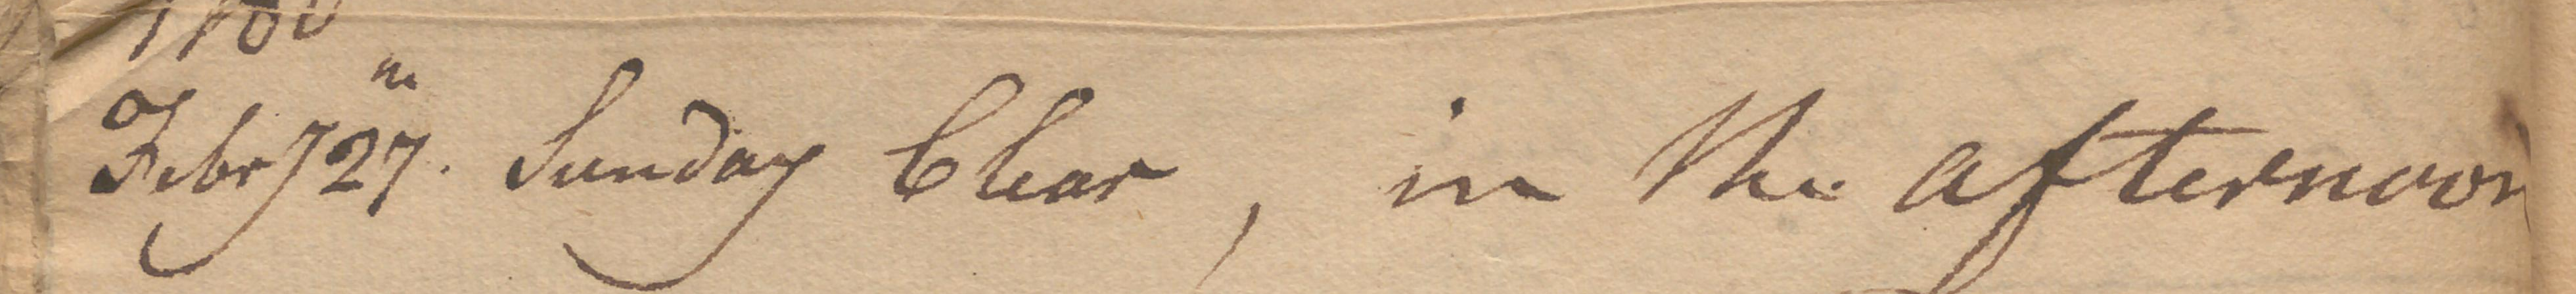Febr^y 27^th. Sunday Clear, in the afternoon
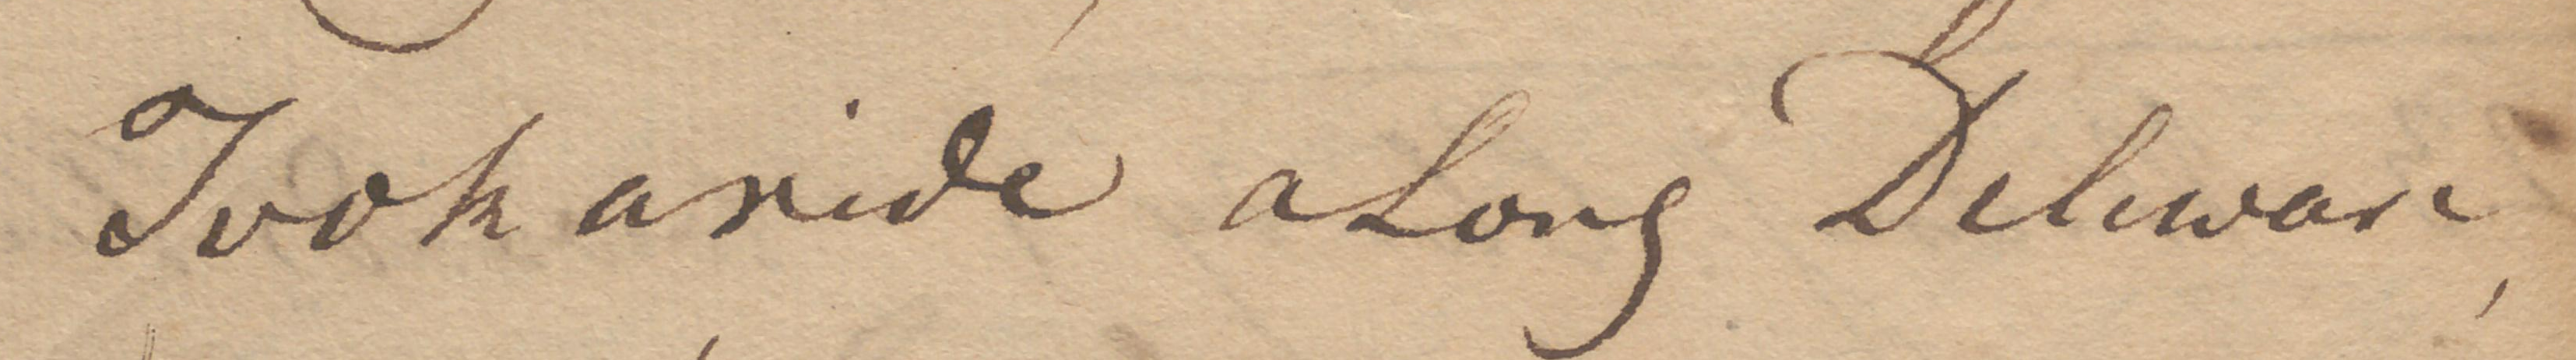Took a ride along Deleware,
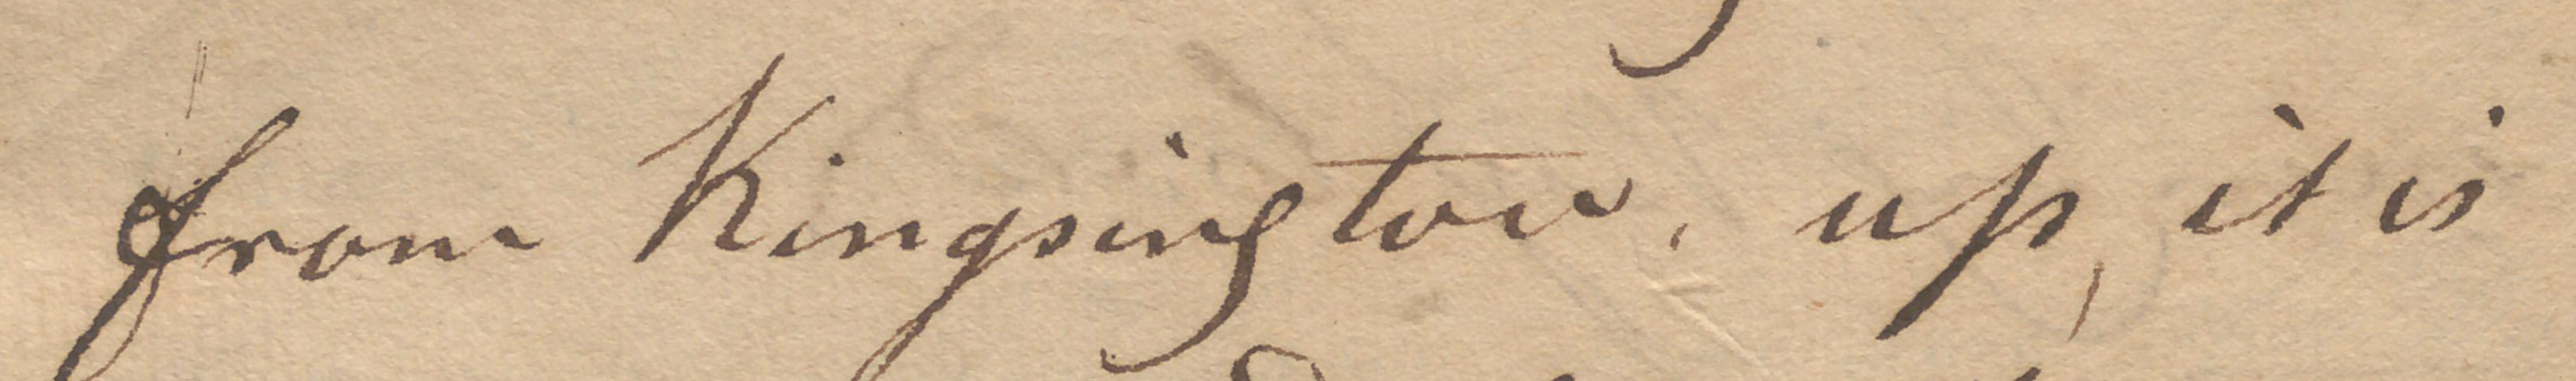from Kingsington, up it is
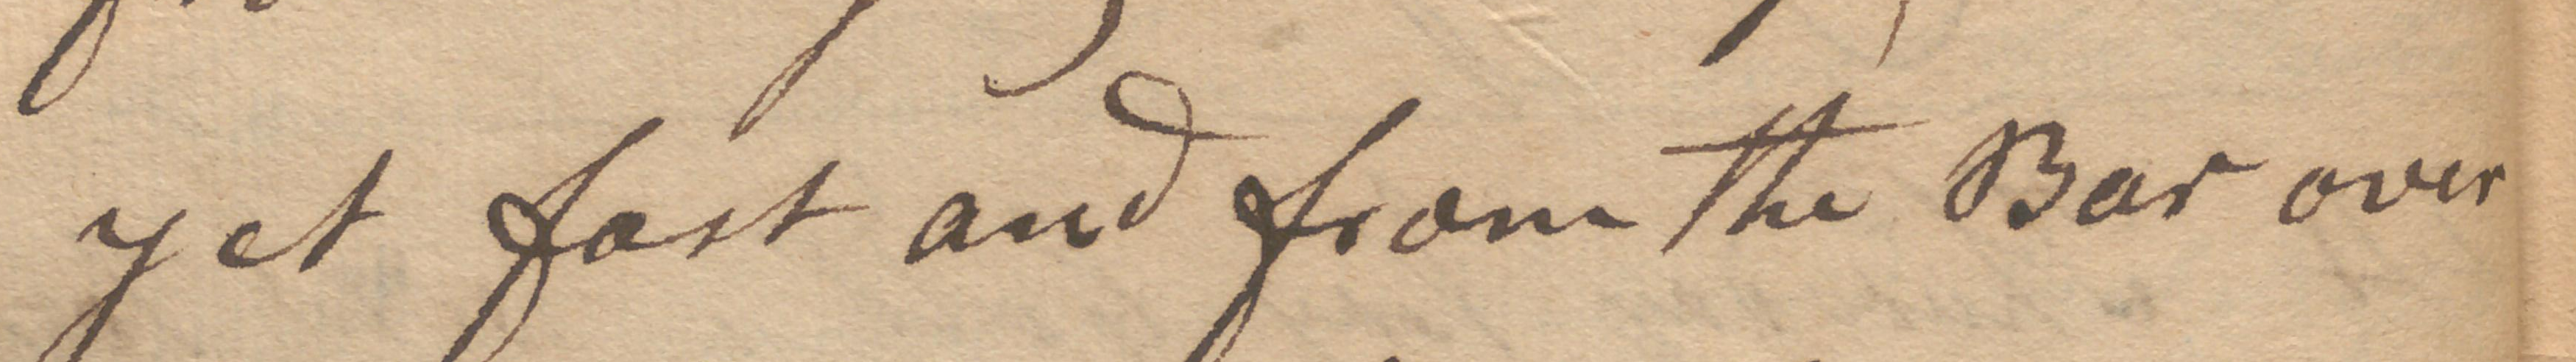yet fast and from the Bar over
